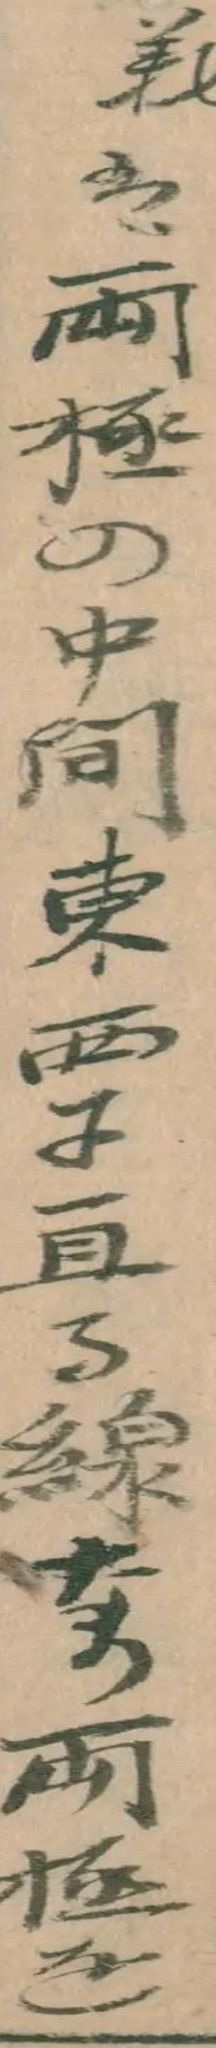の義は両極の中間東西に亘る線なり両極を

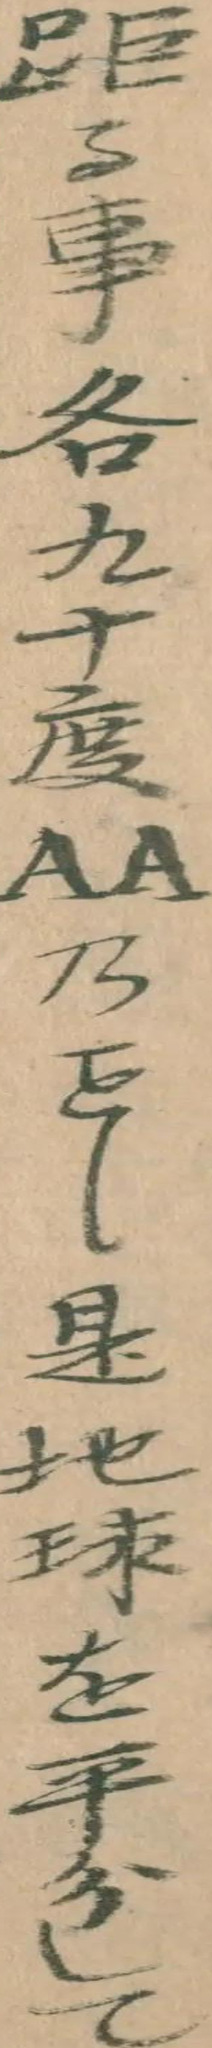距る事各九十度のことし是地球を平分して
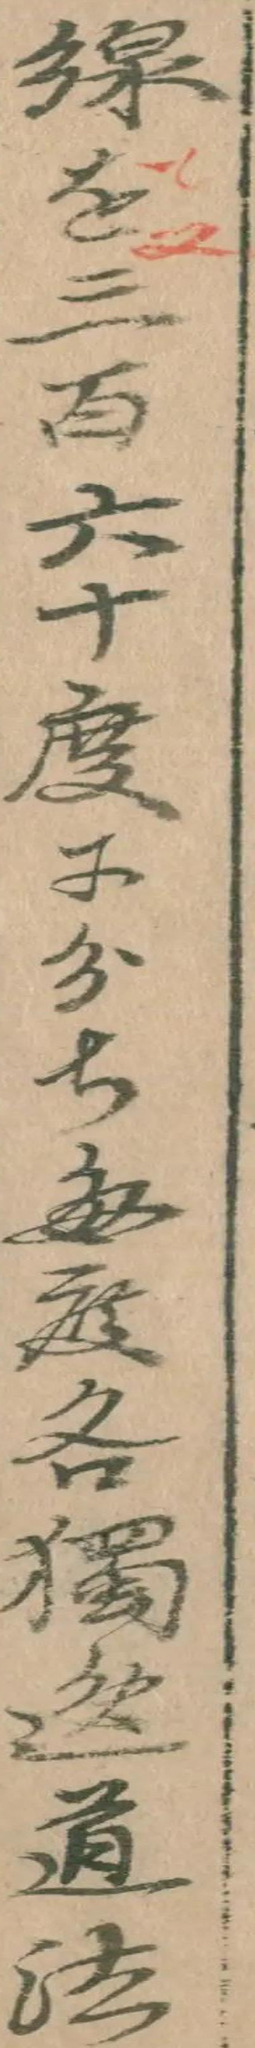線を又三百六十度に分ち毎度各独逸道法
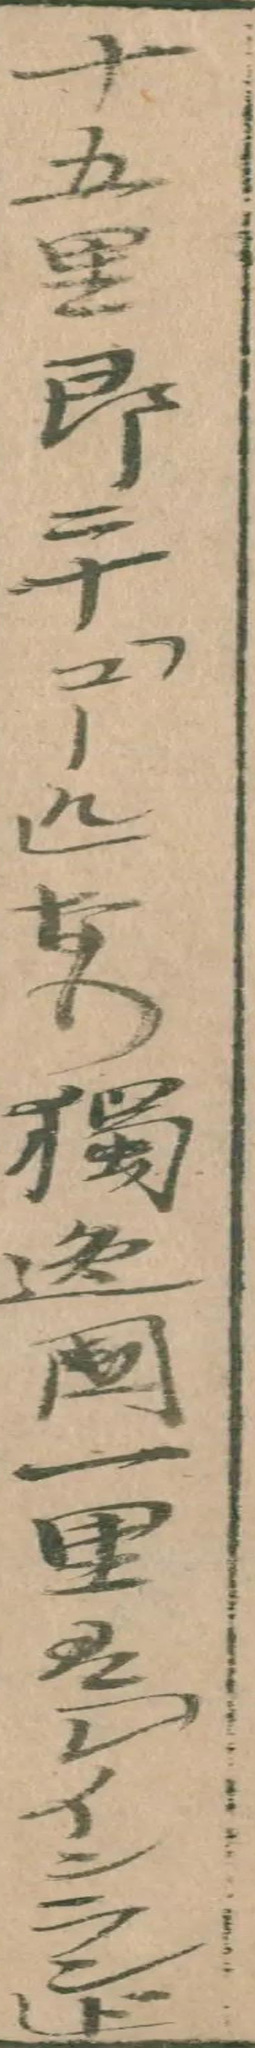十五里即二十「ユール」なり独逸国一里は「レインランド」
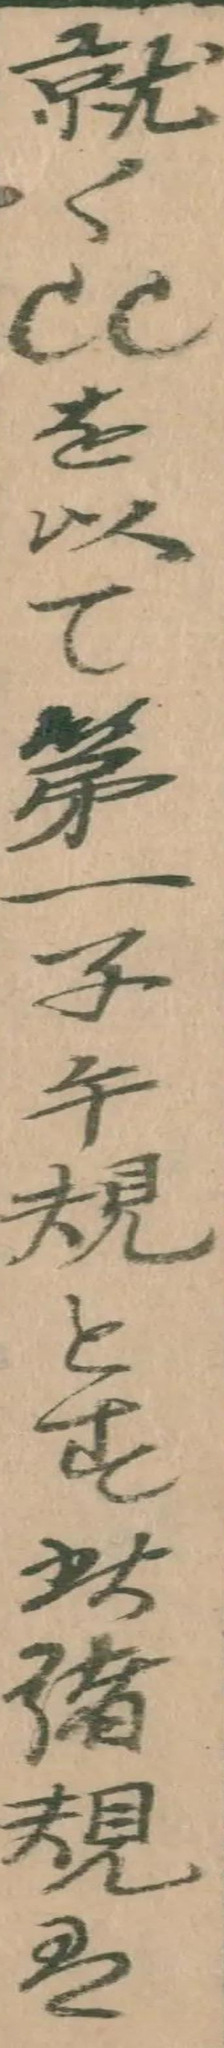就くを以て第一子午規とす此諸規は
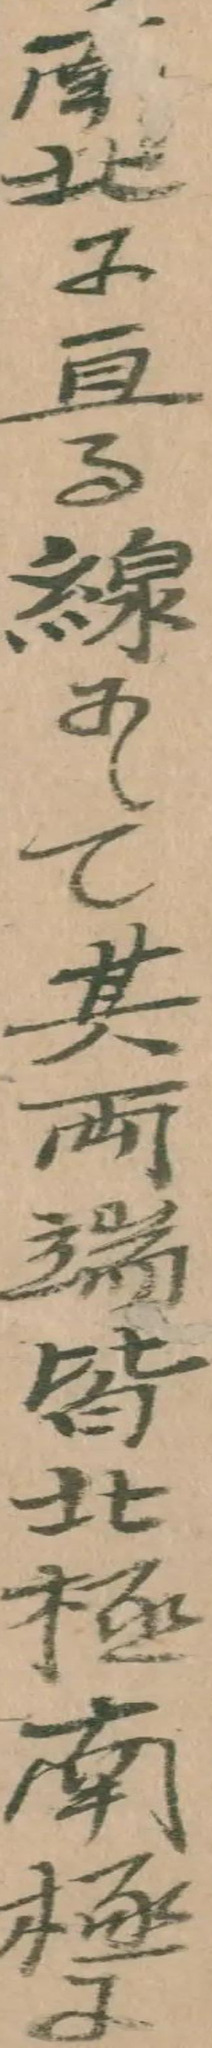南北に亘る線にして其両端皆北極南極に
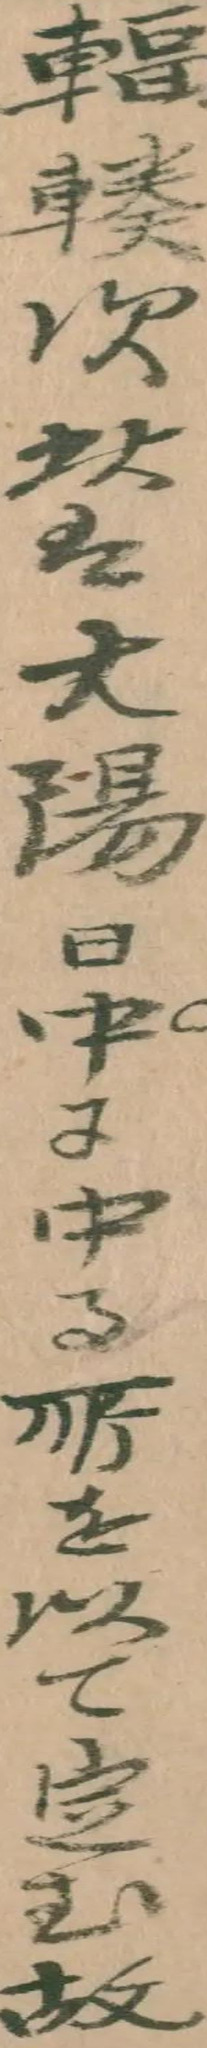輻輳す此は大陽日中に中る所を以て定む故
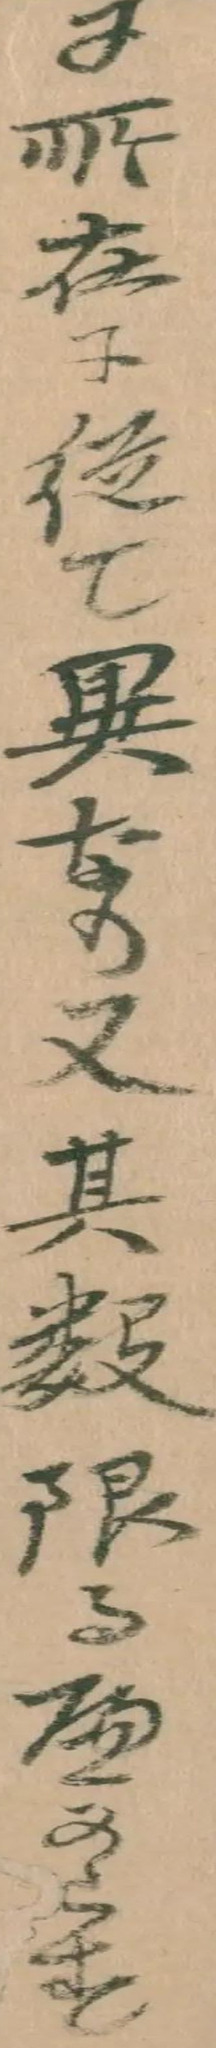に所在に従て異なり又其数限るへからす
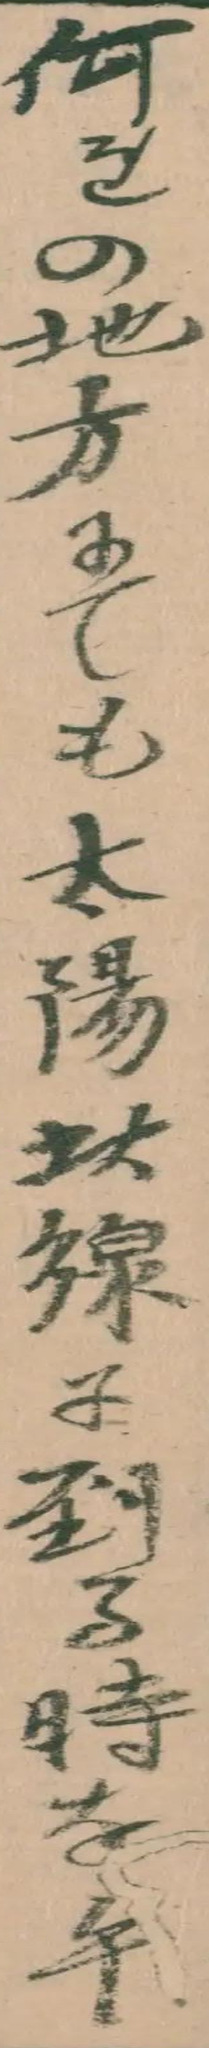何れの地方にても太陽此線に到る時を午
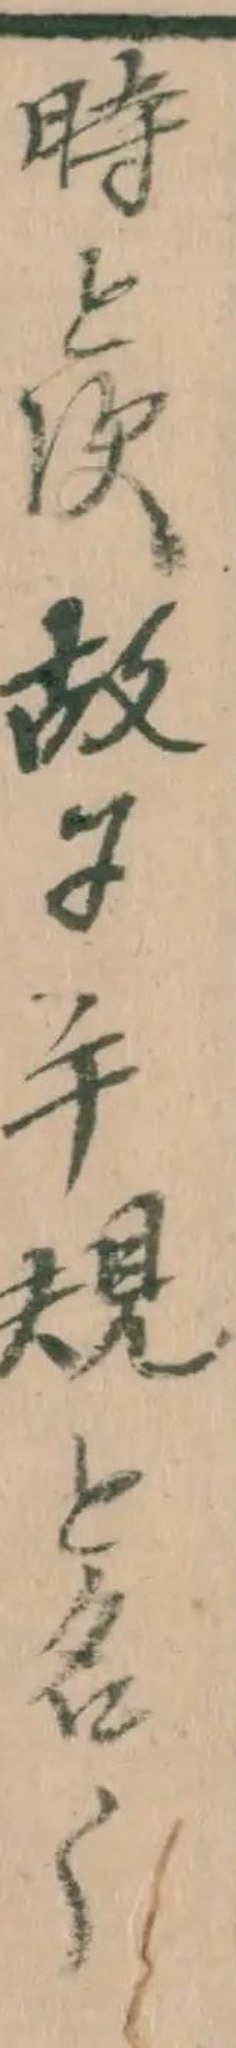時とす故に午規と名く
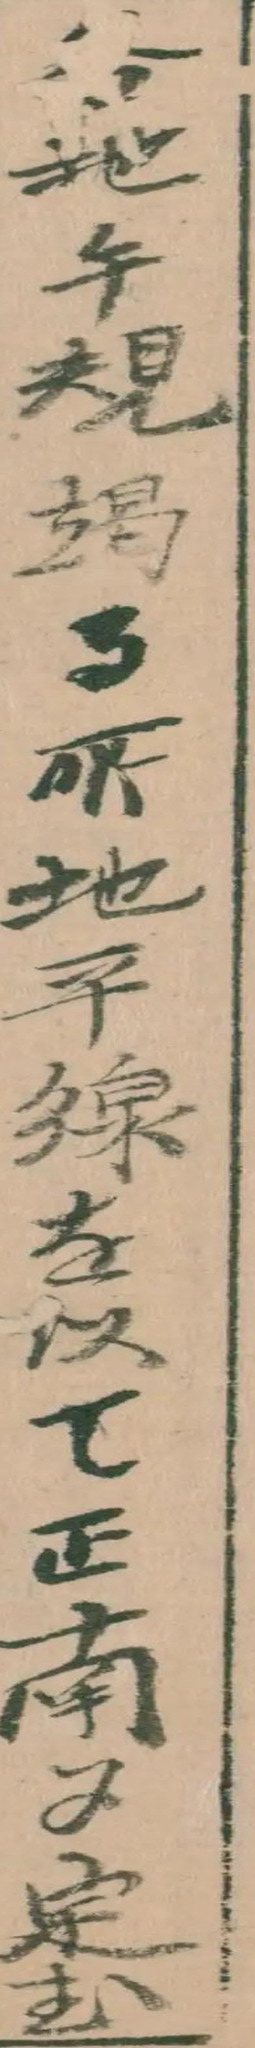各地午規竭る所地平線を以て正南に定む
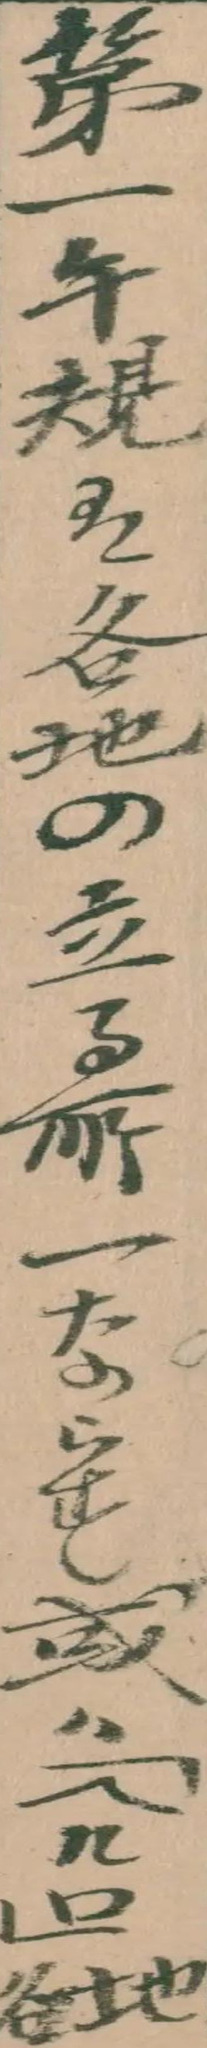第一午規は各地の立る所一ならす或ハ「ヘルロ」地名
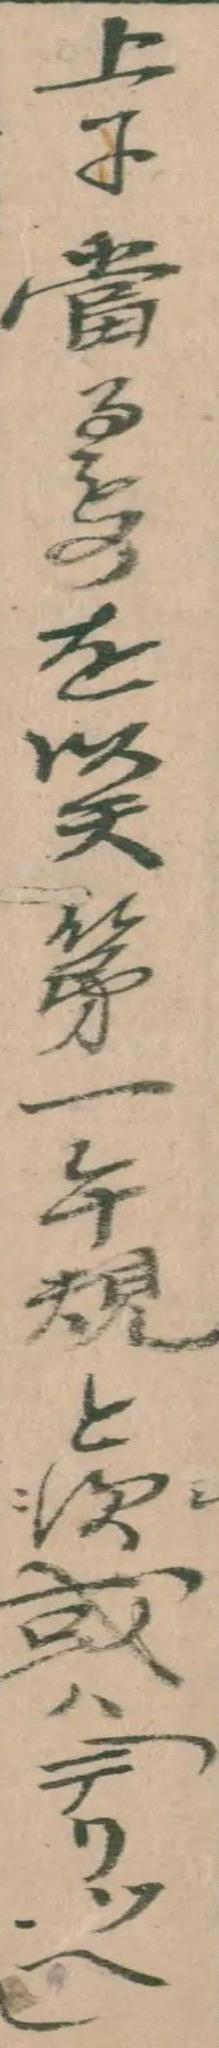上に当るものを以天第一午規とす或ハ「テリツヘ」
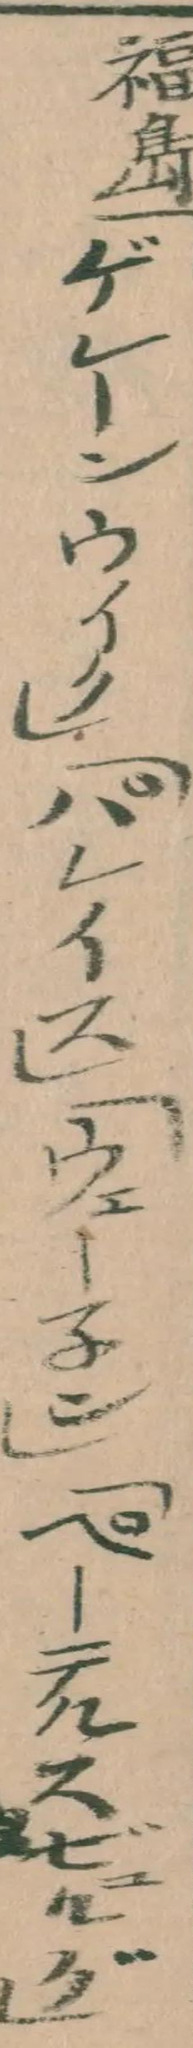福島「ゲレーンウイク」「パレイス」「ウェーネン」「ペーテルスビュルグ」
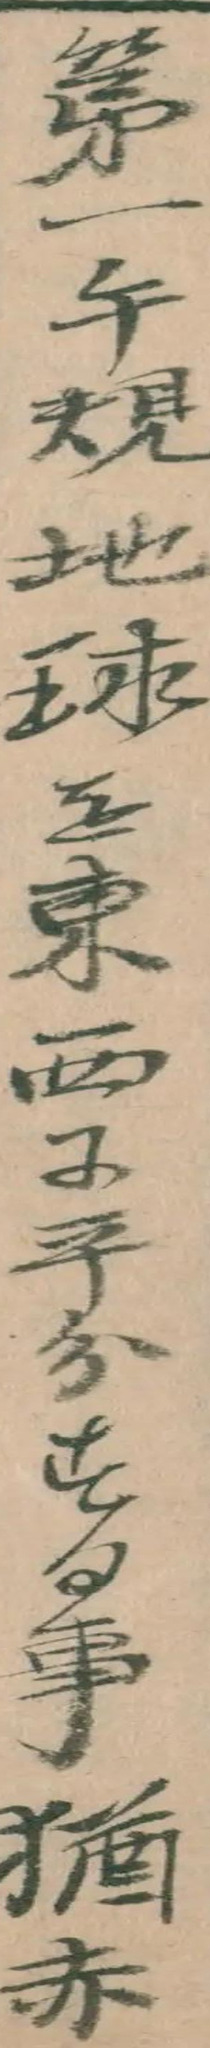第一午規地球を東西に平分する事猶赤
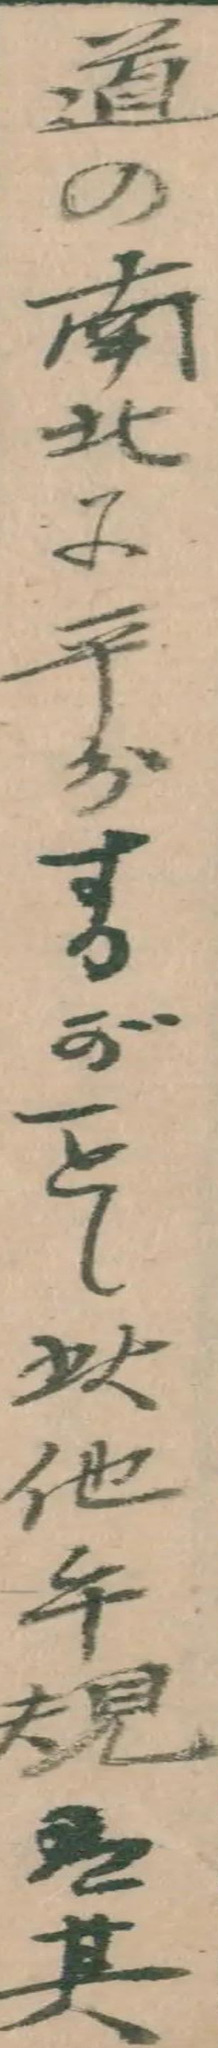道の南北に平分するがことし此他午規は其
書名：新釈輿地図説
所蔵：国立国会図書館 National Diet Library, JAPAN
